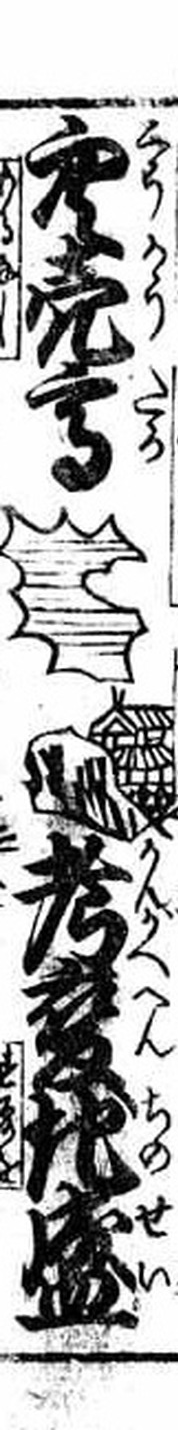空売高考変地盛
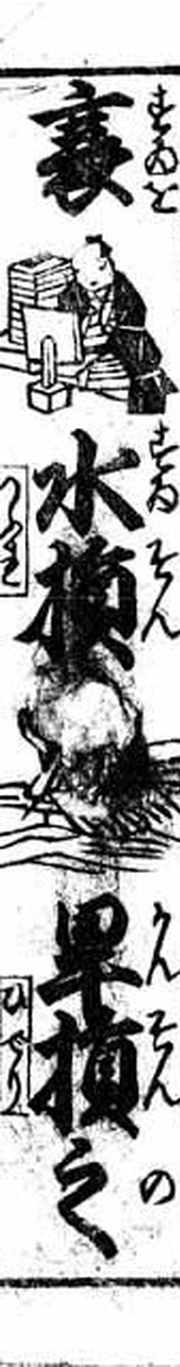衰水損旱損之

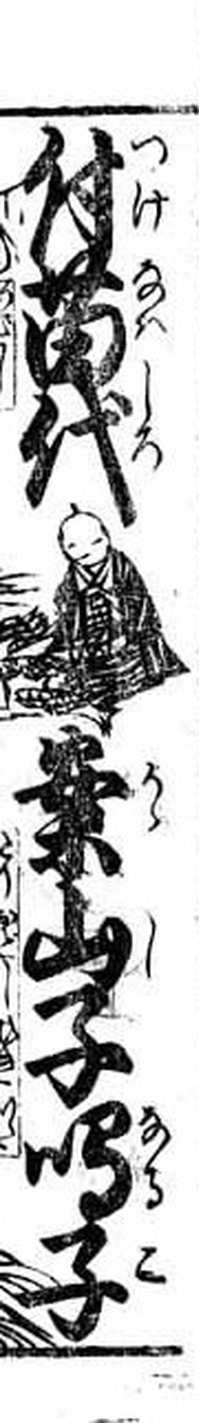付苗代案山子鳴子

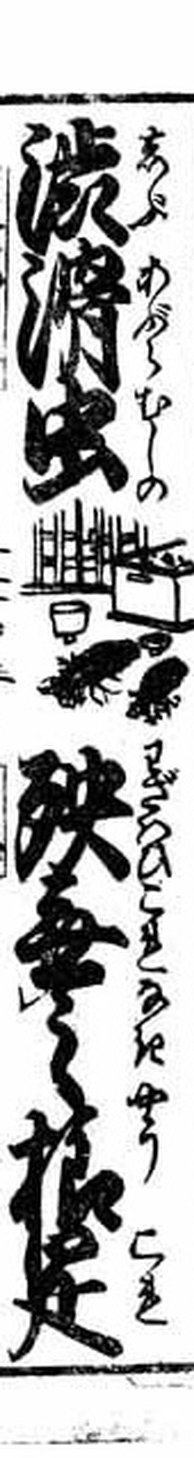渋滑虫殃無之様是
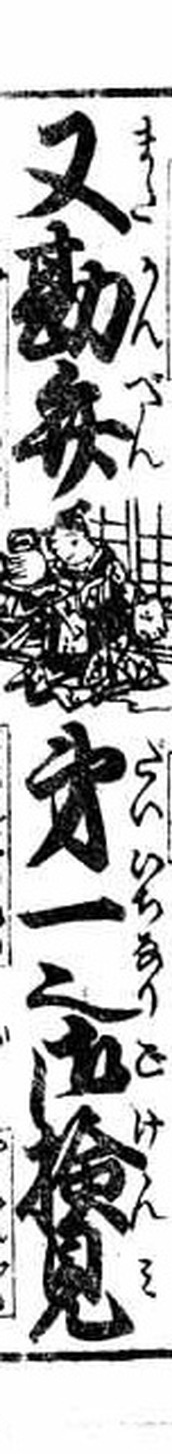又勘弁第一也御検見
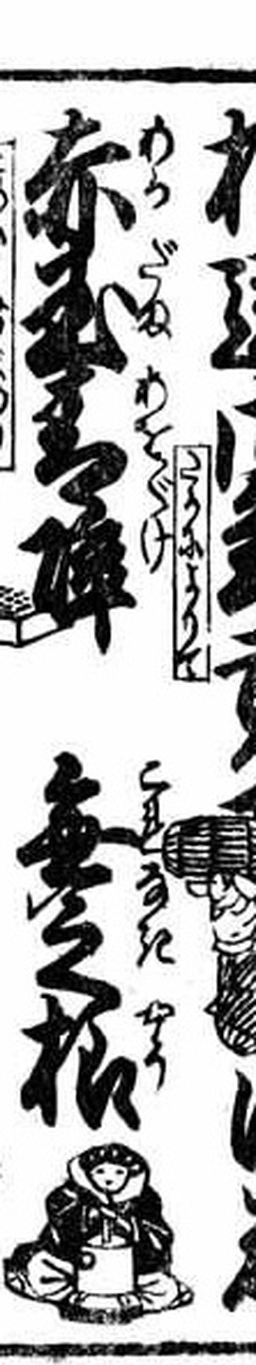赤玉青砕無之様

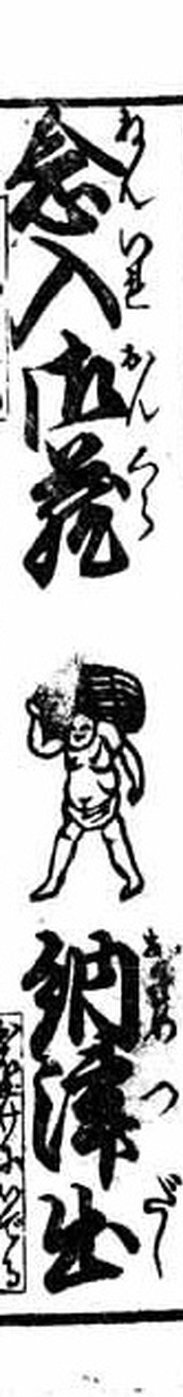念入御蔵納津出
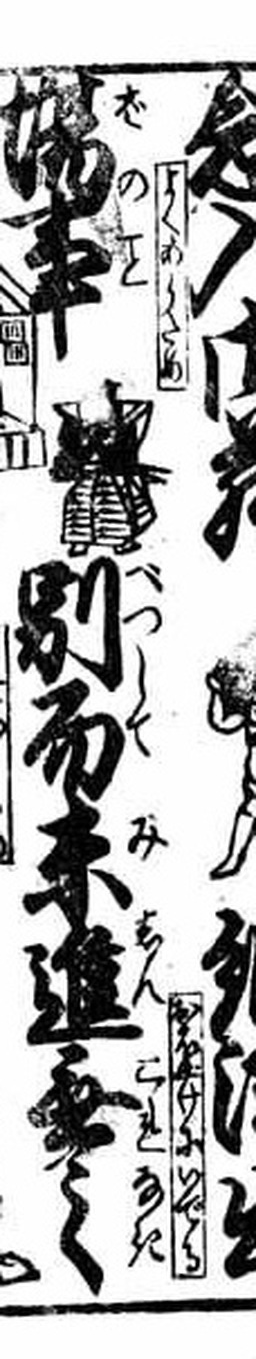場事別而未進無之
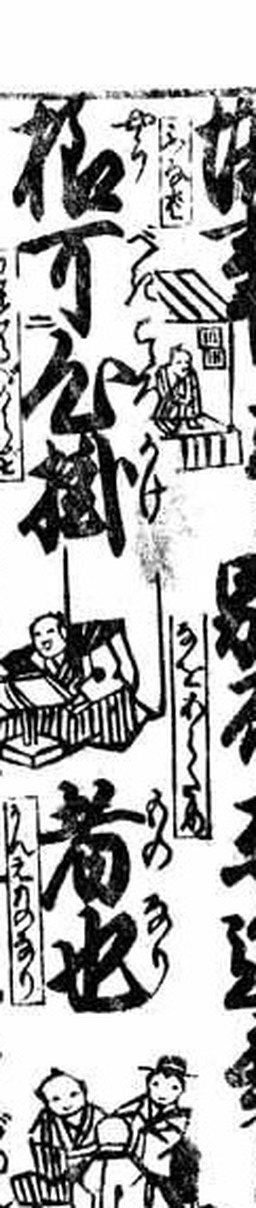様可心掛者也
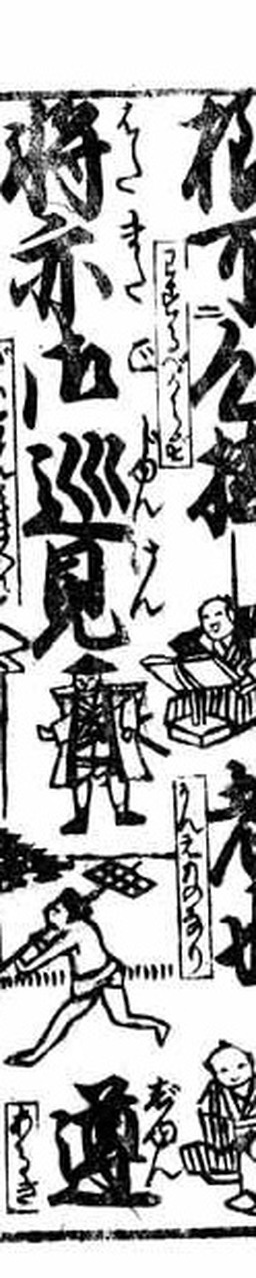将亦御巡検遵
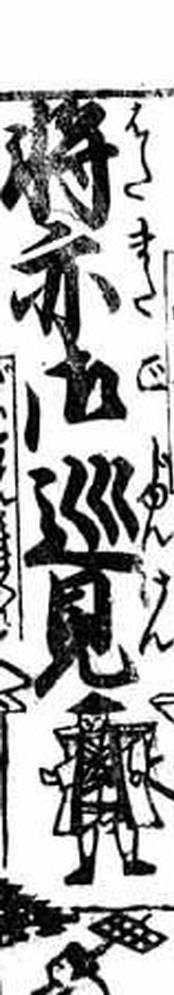将亦御巡検遵
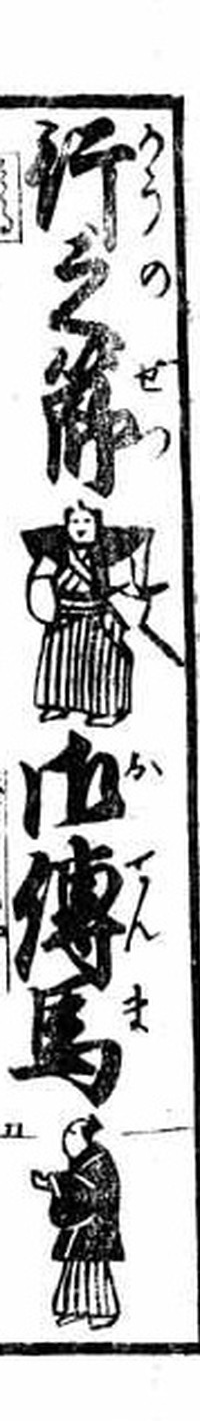行之節御伝馬

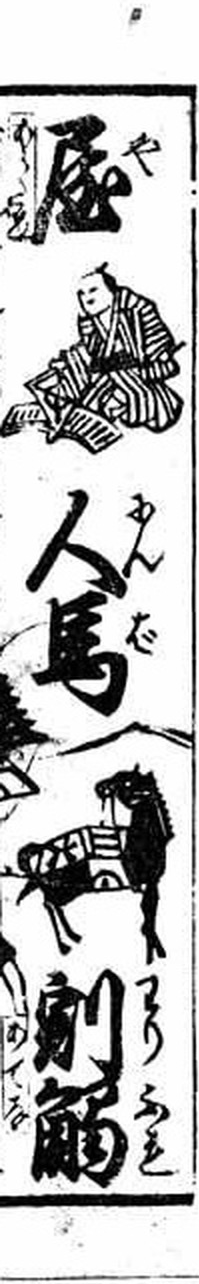屋人馬割触
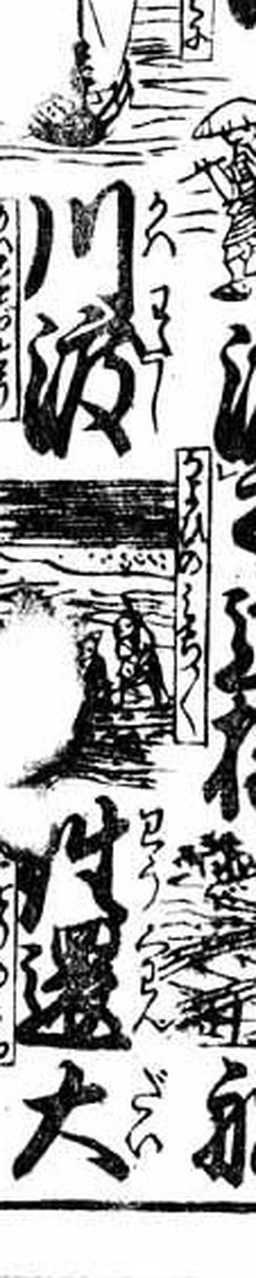川渡往還大
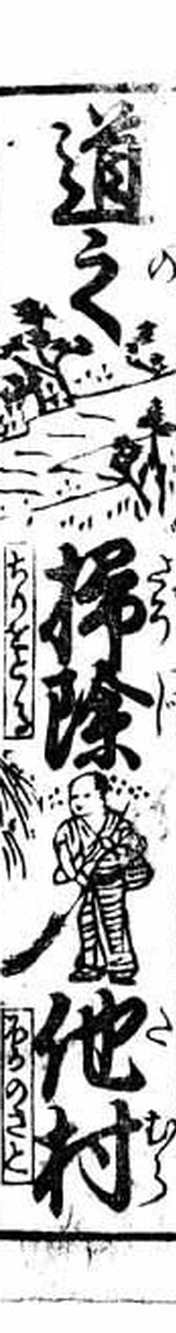道之掃除他村

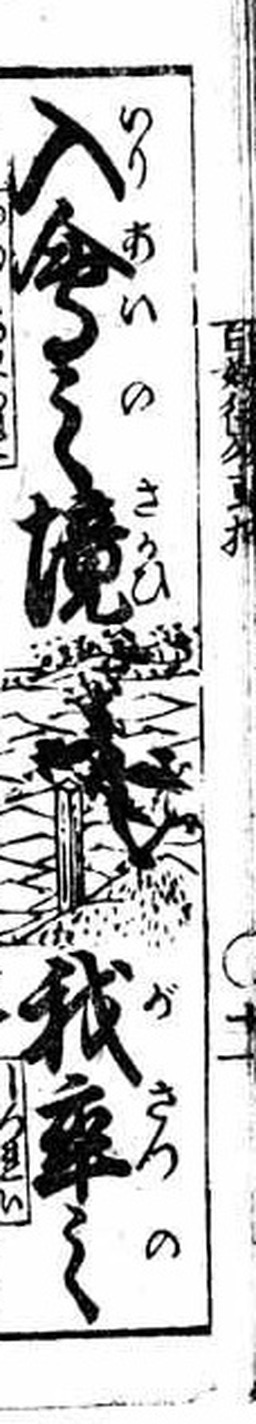入会之境我卒之
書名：百姓往来画抄
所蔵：東京学芸大学教育コンテンツアーカイブ
